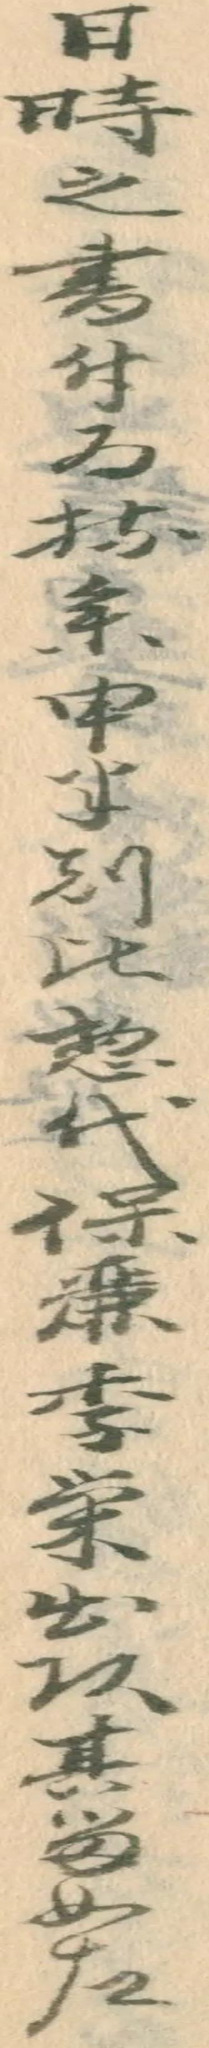日時之書付為持参申半刻比惣代保兼季栄出頭其留如左

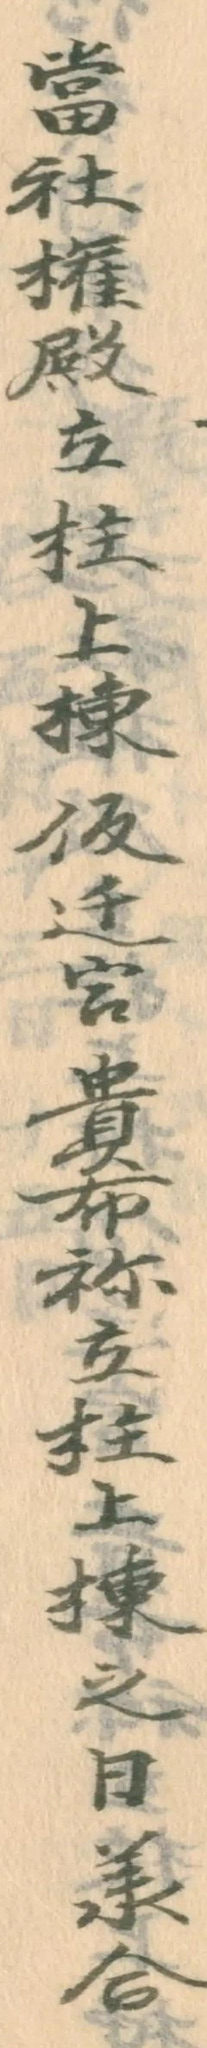当社権殿立柱上棟仮迁宮貴布祢立柱上棟之日承合
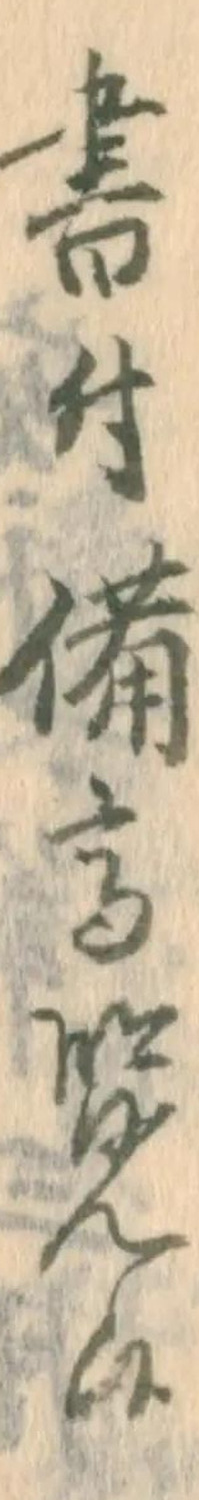書付備高覧候
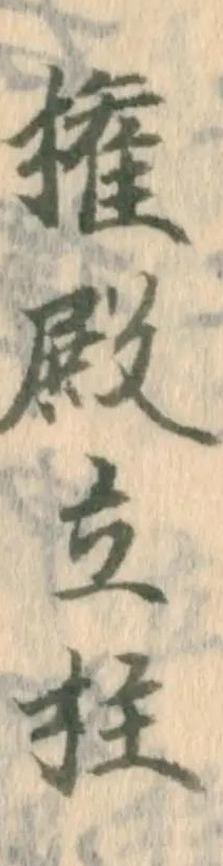権殿立柱
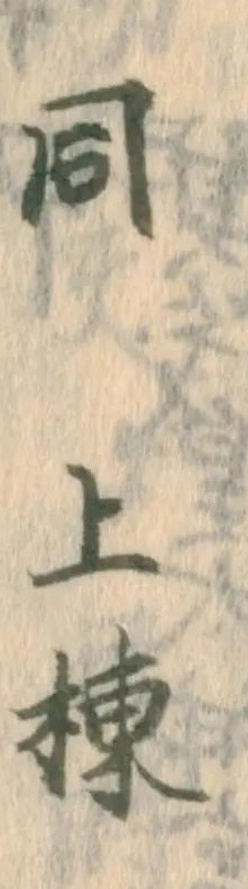同上棟
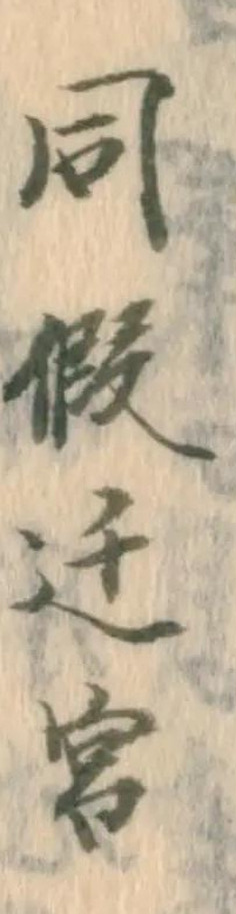同仮迁宮
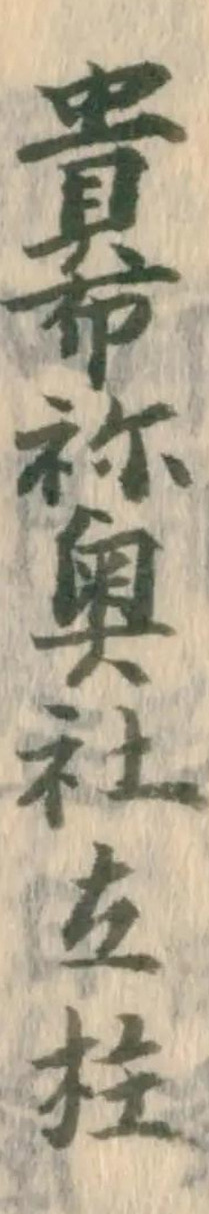貴布祢奥社立柱
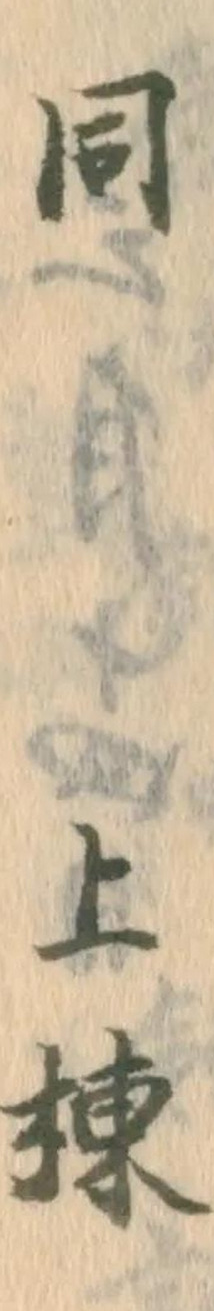同上棟
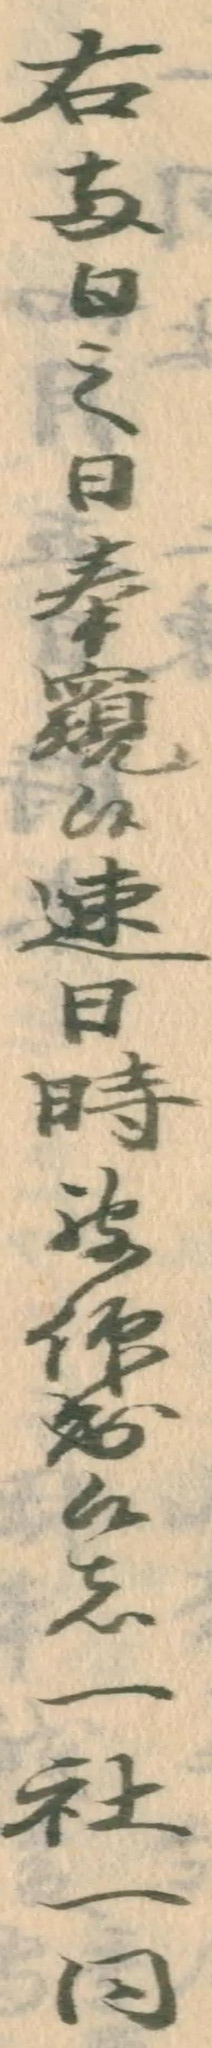右両日之日奉窺候速日時被仰出候者一社一同
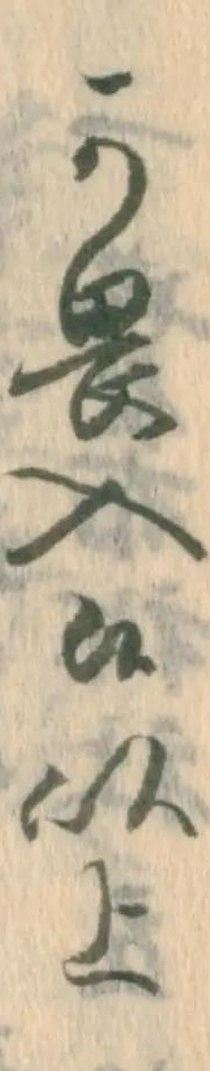可畏入候以上
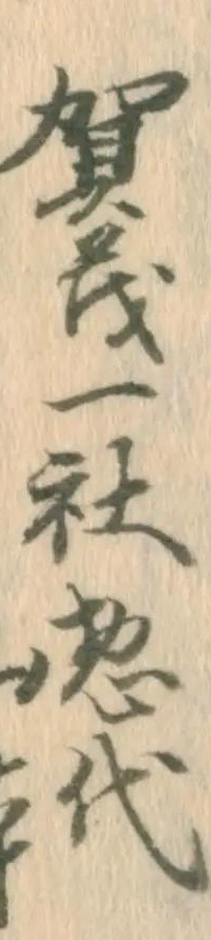賀茂一社惣代
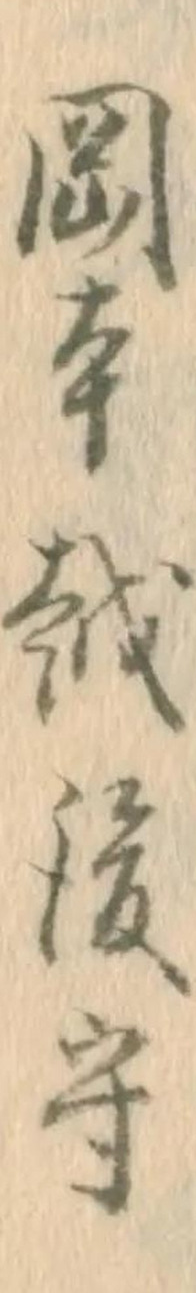岡本越後守
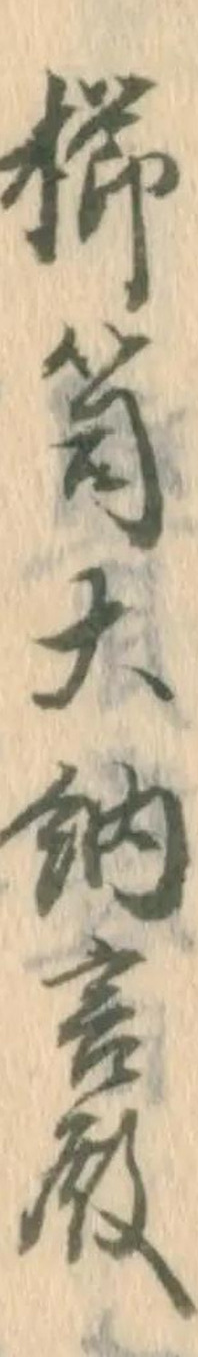櫛笥大納言殿
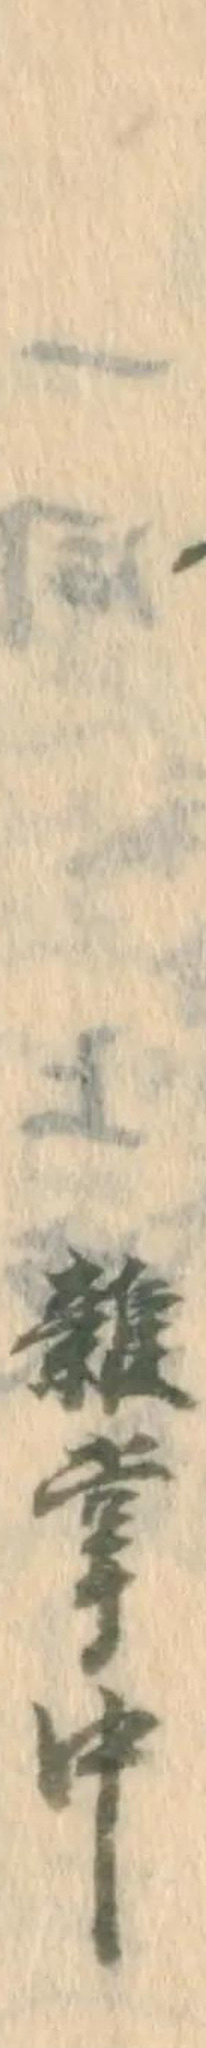雑掌中
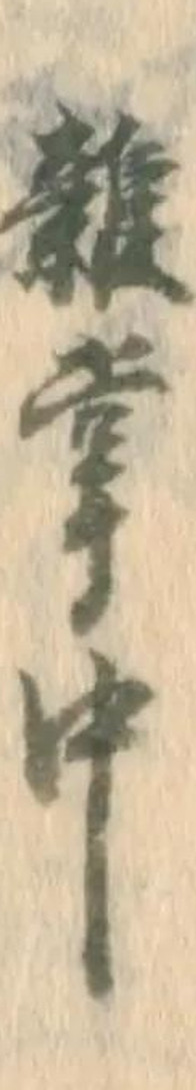雑掌中
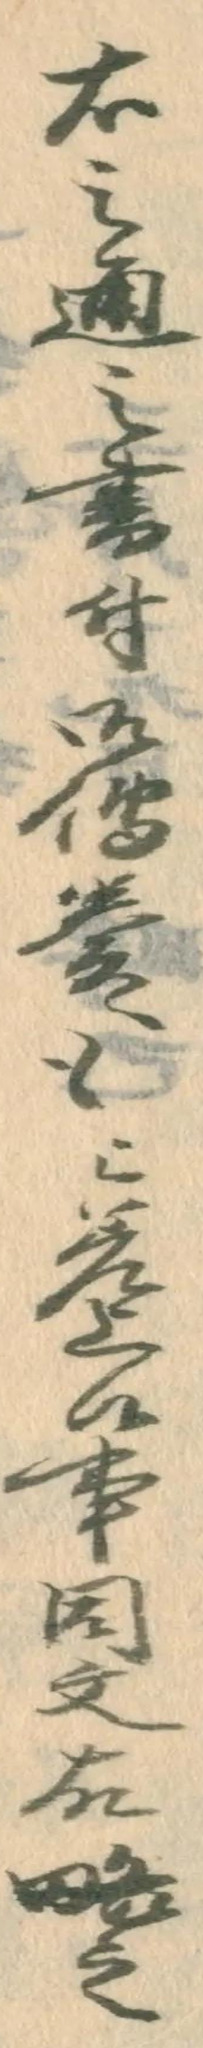右之通之書付御伝奏へも被差上候事同文故略之
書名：賀茂社記録. 第17冊
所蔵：国立国会図書館 National Diet Library, JAPAN
